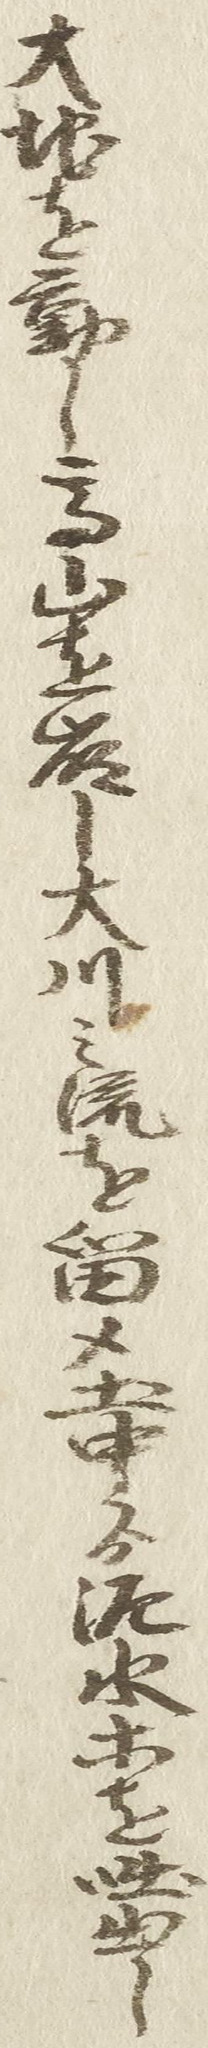大地ヲ動し高山を崩大河之流を留メ土中ゟ泥水を咄出し
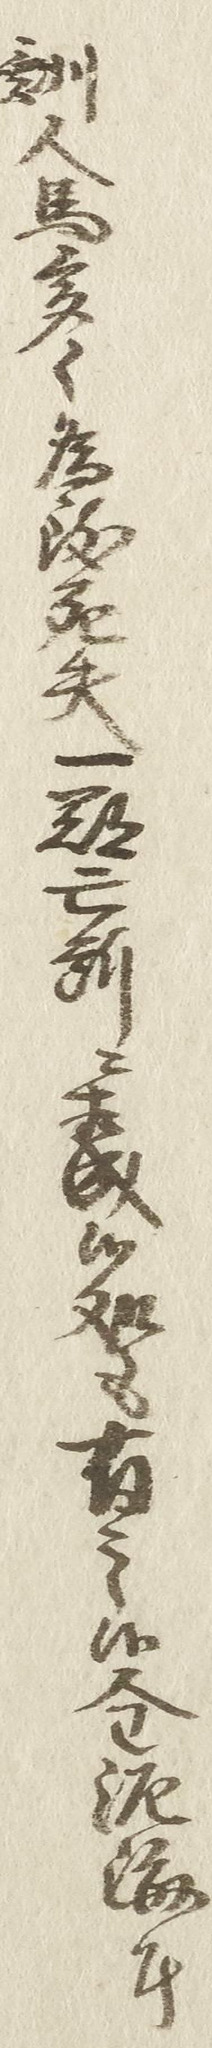剰人馬多く危険死失一郡亡所二相成候処も有之侯令泥海に
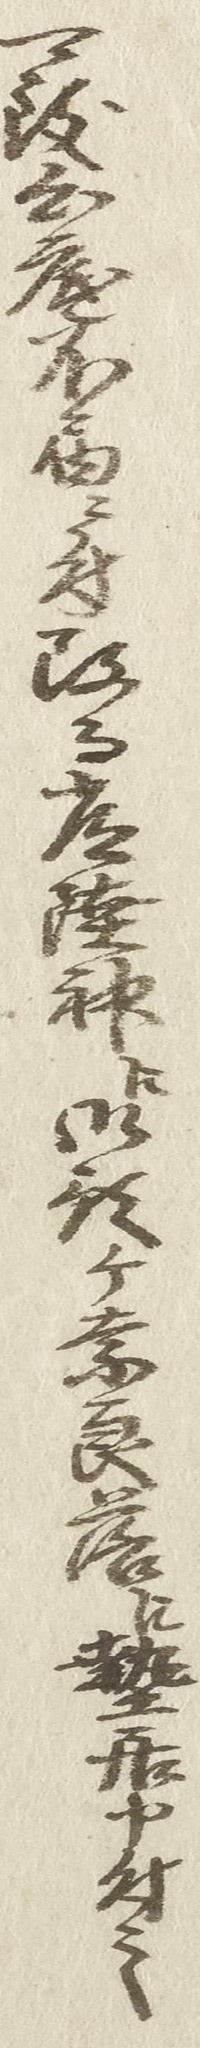可致心底不届二付改而常陸神江御預ケ奈良落江蟄居申付之
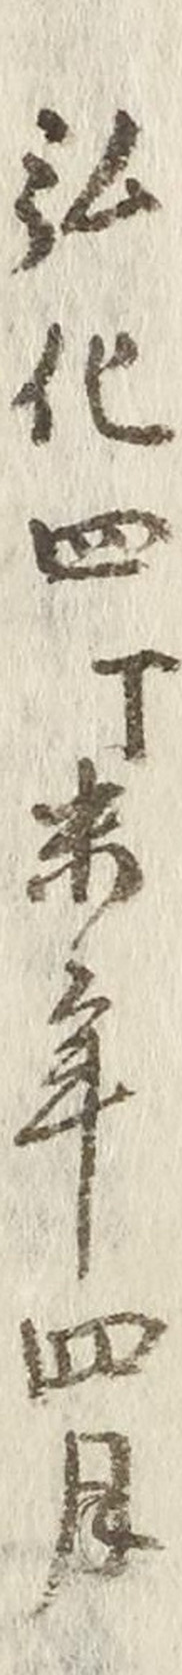弘化四丁未四月

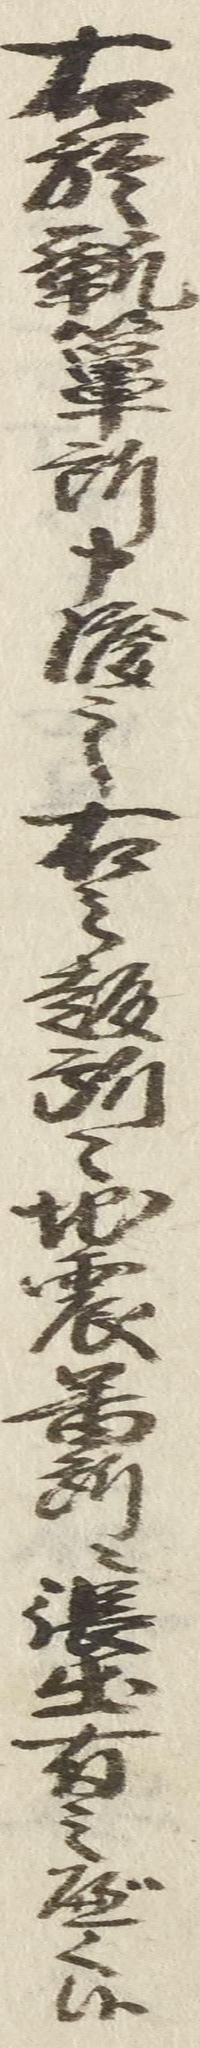右於瓢箪所申す之右之趣所々地震番所ニ張出有之べく候
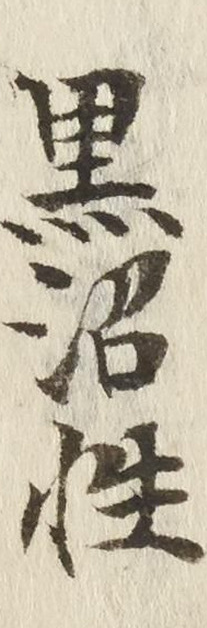黒沼性
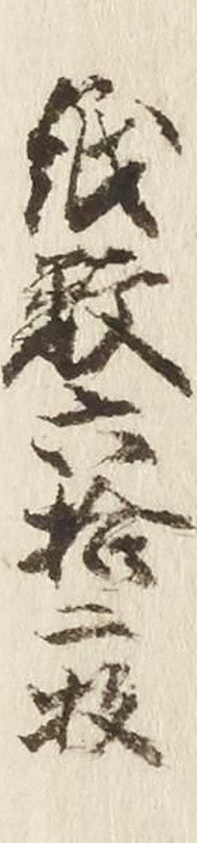紙数六拾二枚
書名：従往古地震御届書記誌之一
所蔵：東京大学地震研究所図書室 Earthquake Research Institute Library, The University of Tokyo, JAPAN
